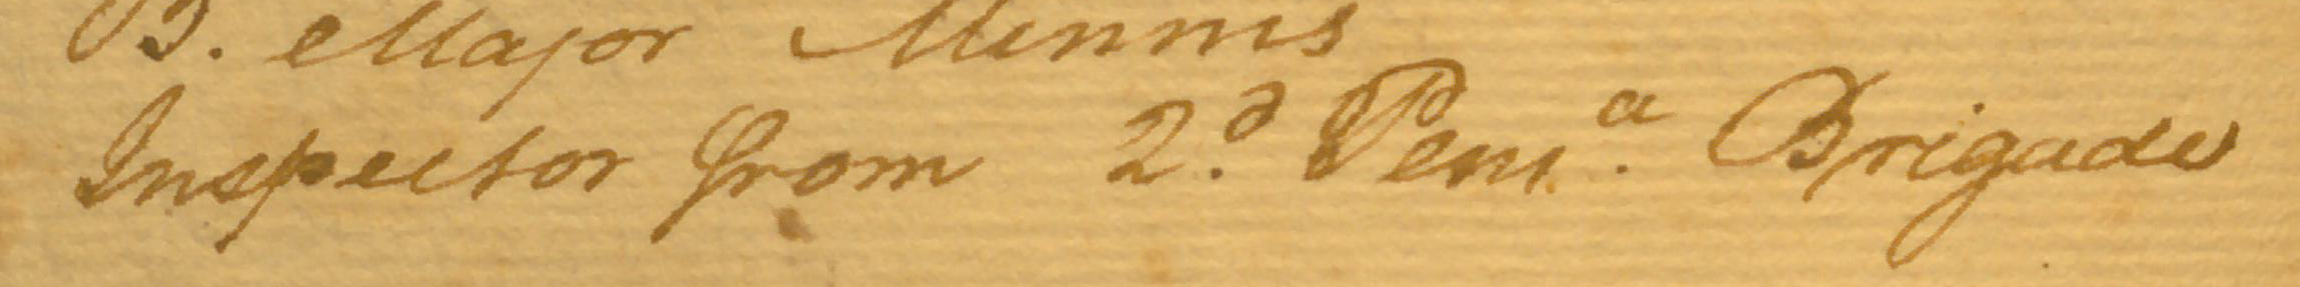Inspector from 2^d. Pens^a. Brigade
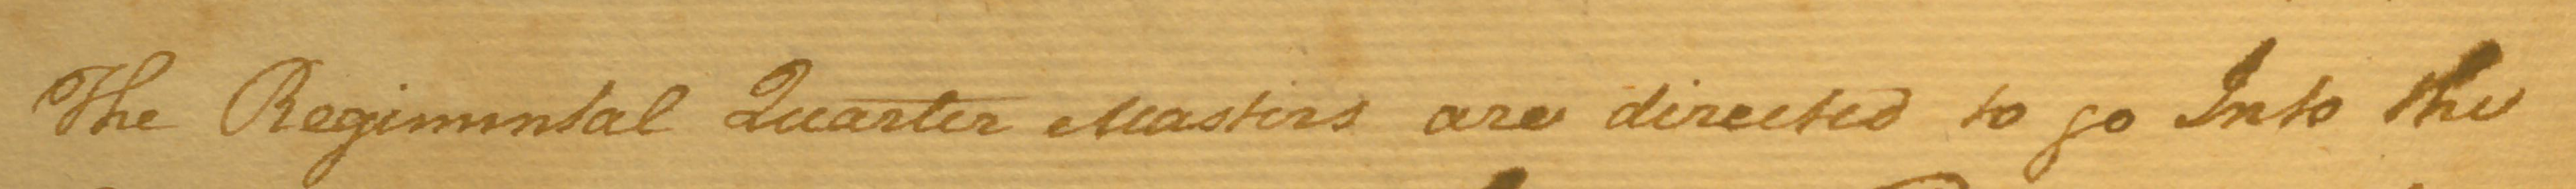The Regimental Quarter Masters are directed to go Into the
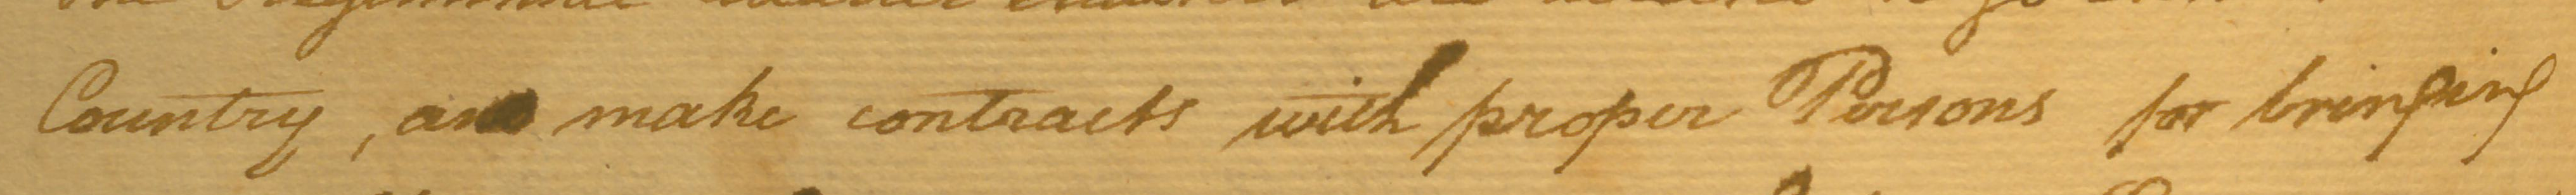Country, and make contracts with proper Persons for bringing
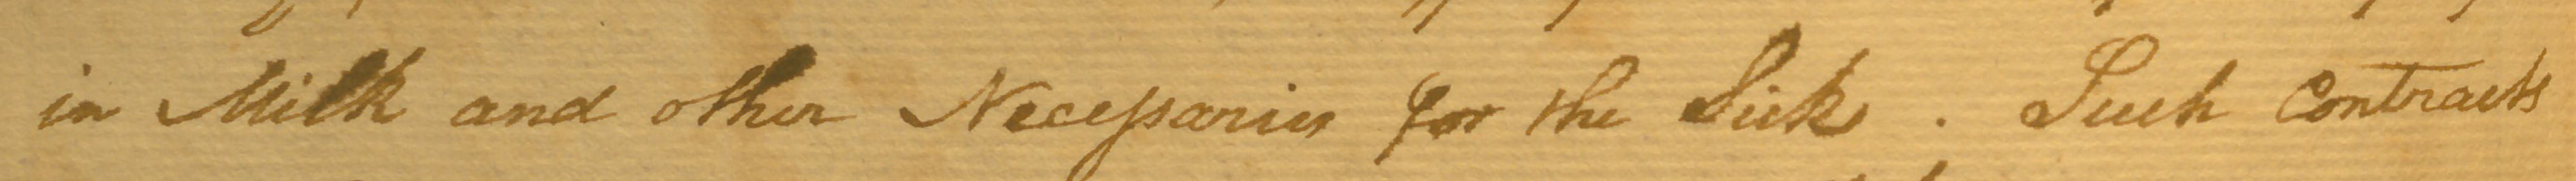in Milk and other Necessaries for the Sick. Such contracts
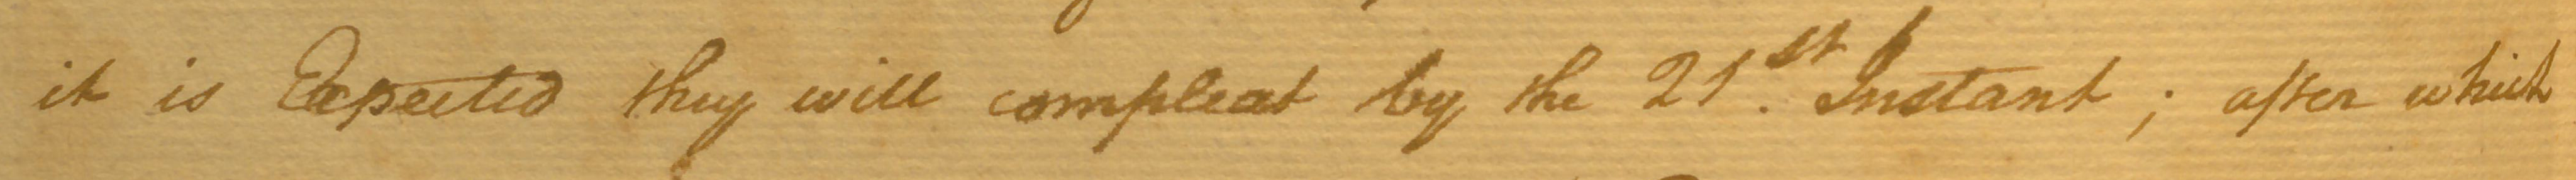it is Expected they will compleat by the 21^st. Instant; after which
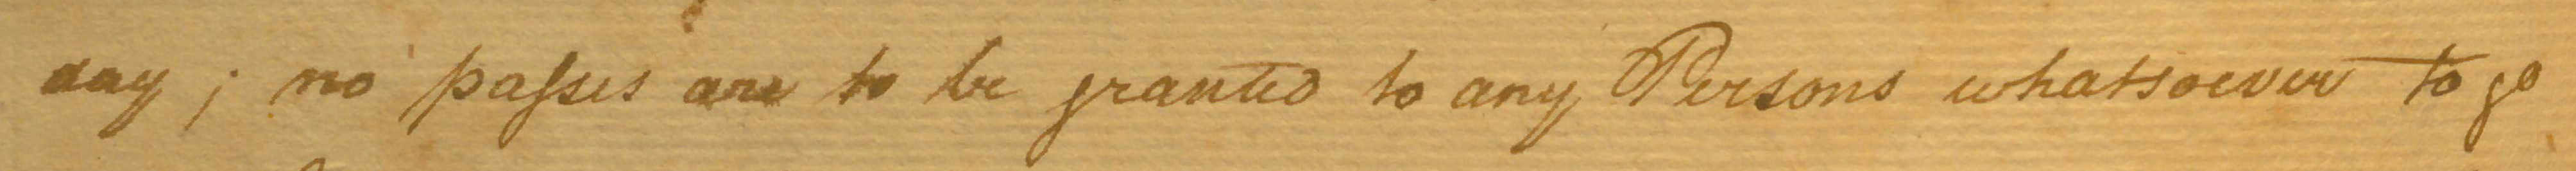day; no passes are to be granted to any Persons whatsoever to go
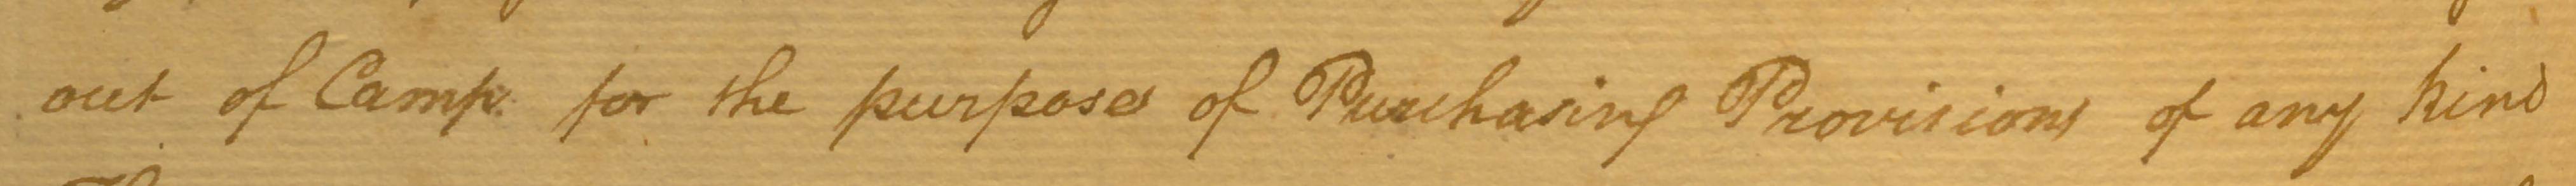out of Camp for the purposes of Purchasing Provisions of any kind
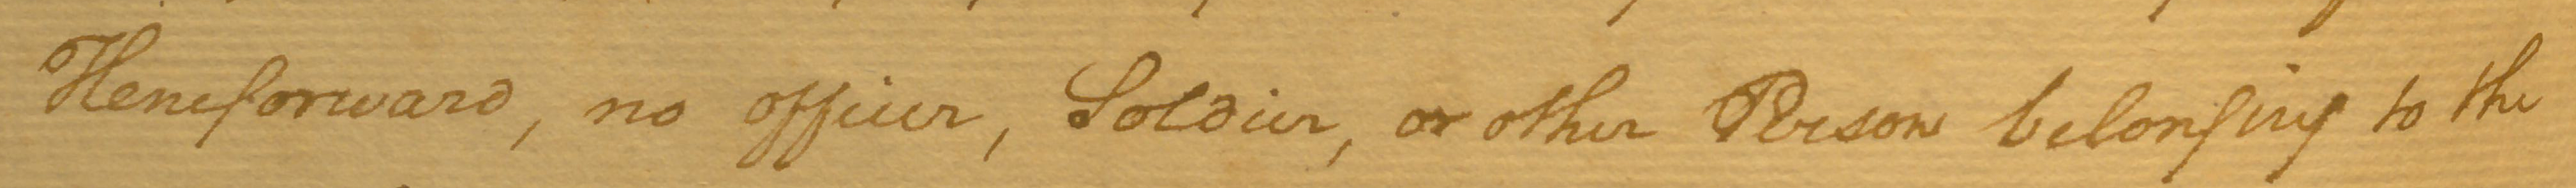Henceforward, no officer, Soldier, or other Person belonging to the
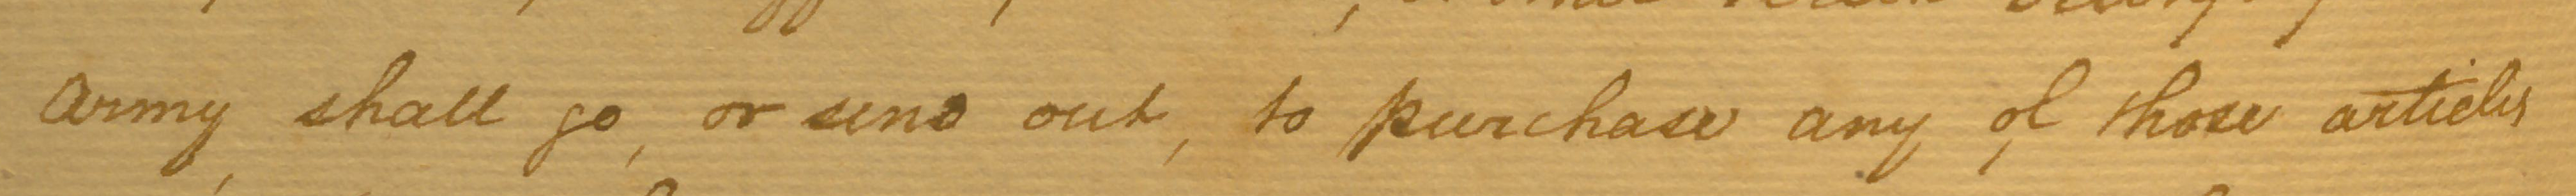Army shall go, or send out, to purchase any of those articles
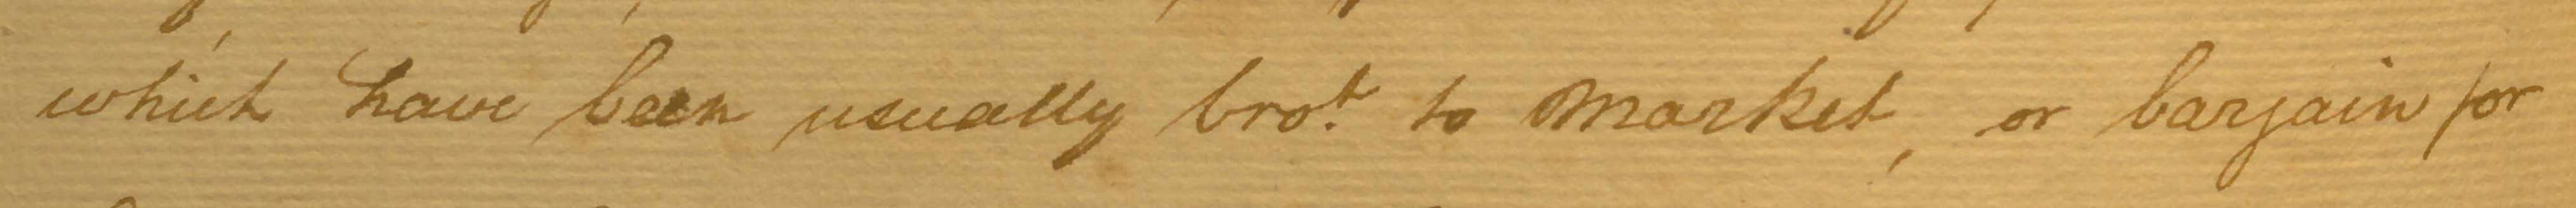which have been usually bro^t. to market, or bargain for
